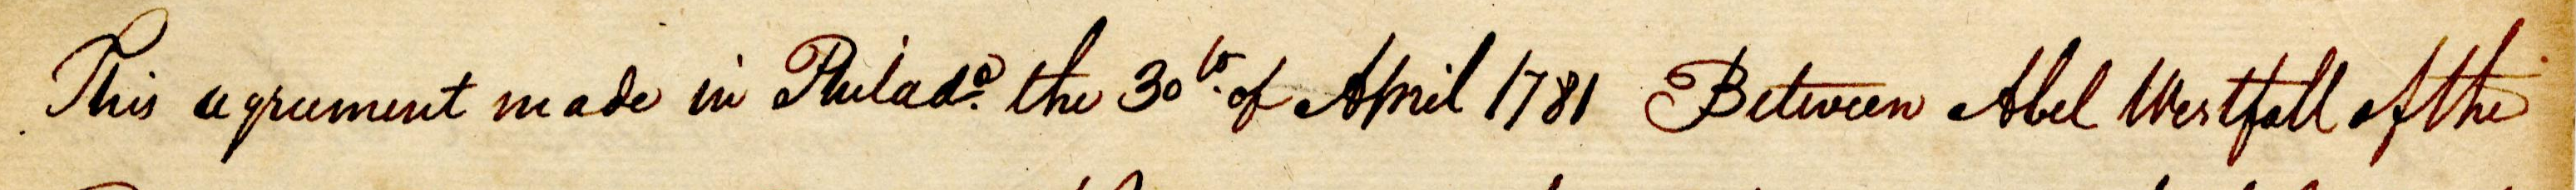This agreement made in Philad^a. the 30^h. of April 1781 Between Abel Westfall of the
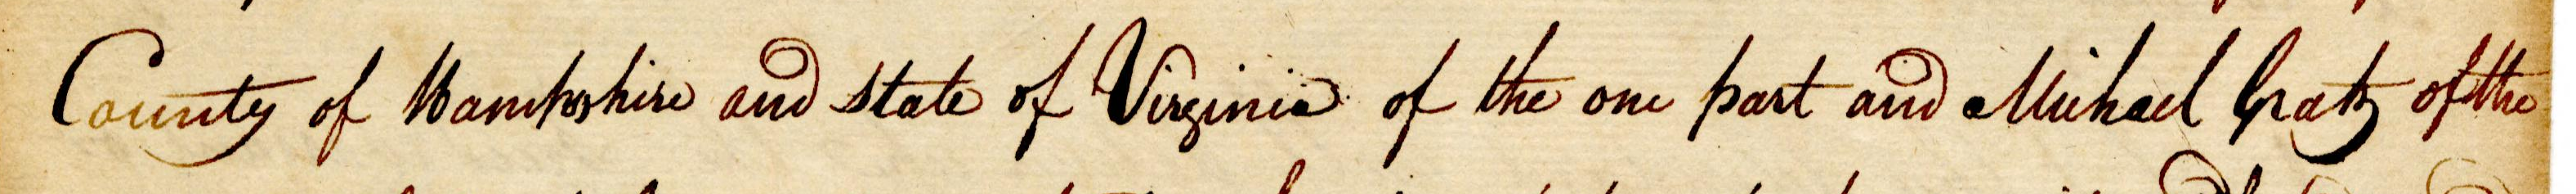County of Hampshire and state of Virginia of the one part and Michael Gratz of the`
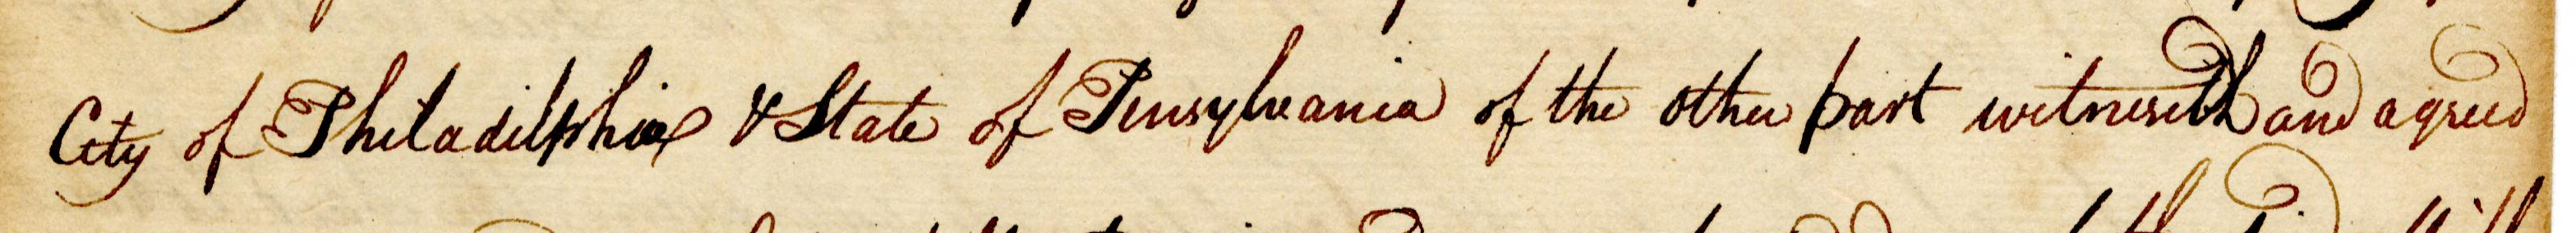City of Philadelphia & State of Pensylvania of the other part witnessed and agreed
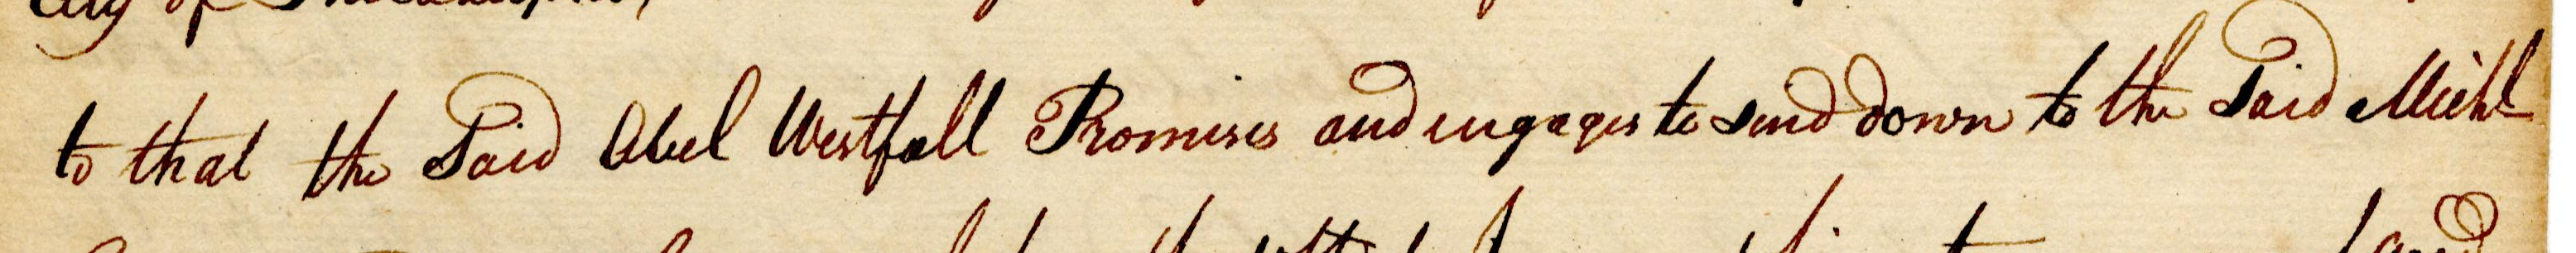to that the said Abel Westfall Promises and engages to send down to the Said Mich^l
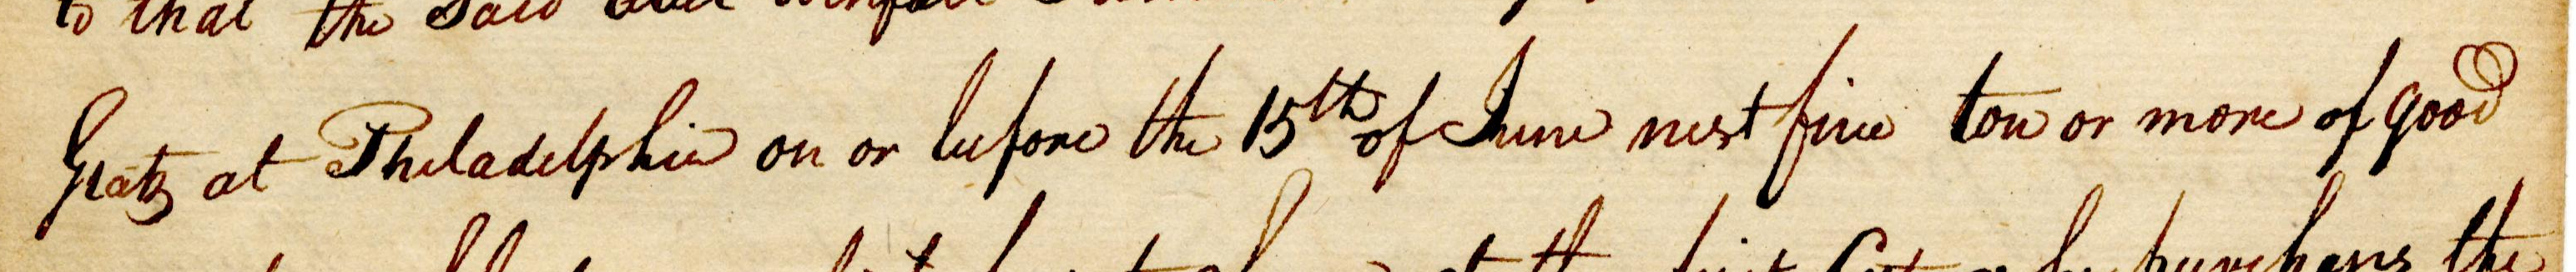Gratz at Philadelphia on or before the 15^th of June next five ton or more of good
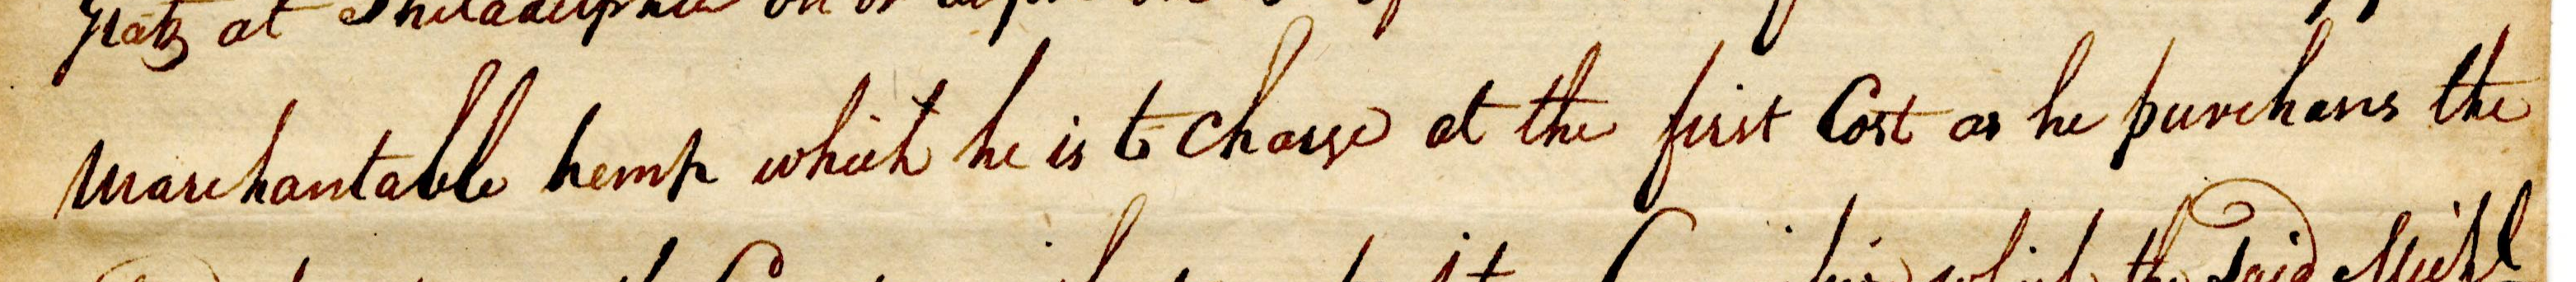marchantable hemp which he is to charge at the first Cost as he purchases the
